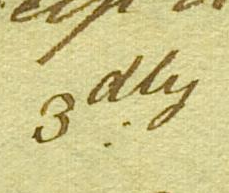3^dly
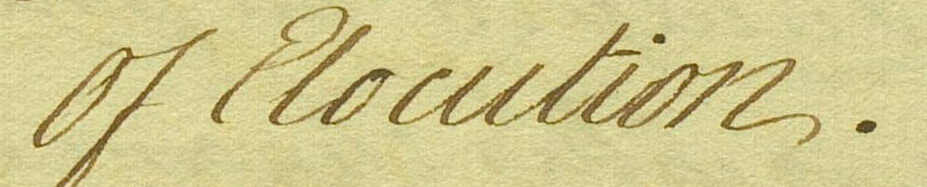Of Elocution.
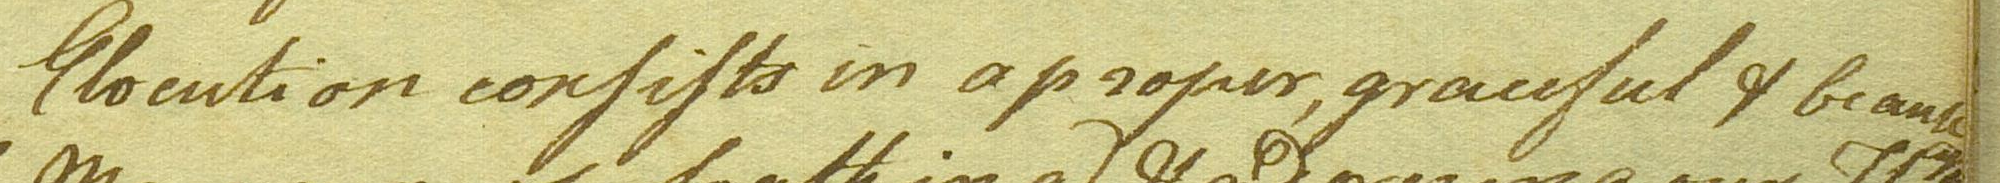Elocution consists in a proper, graceful & beauti
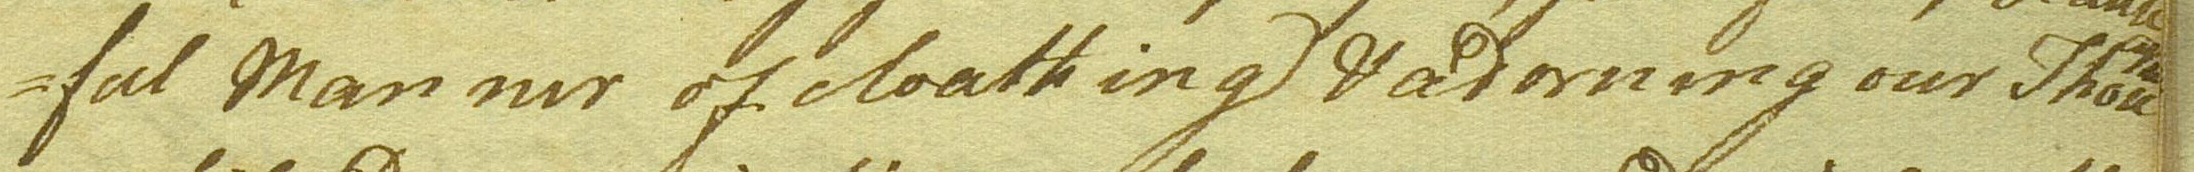-ful Manner of cloathing & adorning our Thou^ghts
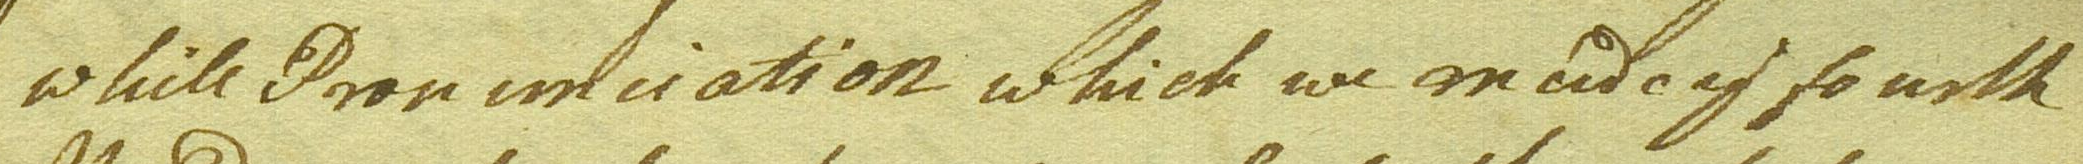while Pronunciation which we made y^e fourth
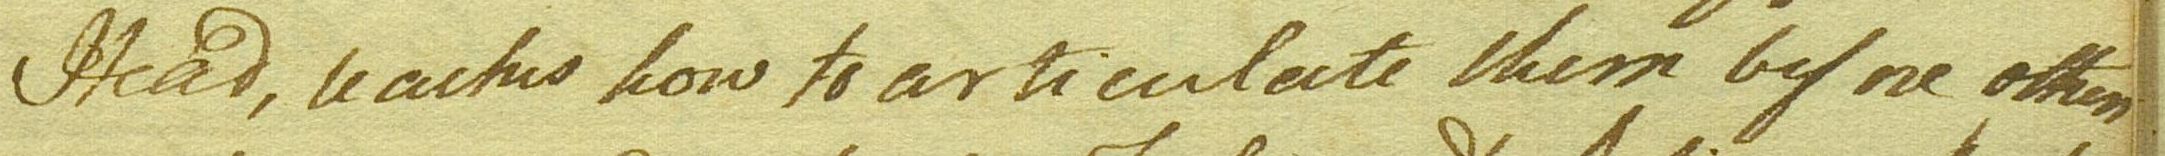Head, teaches how to articulate them before others
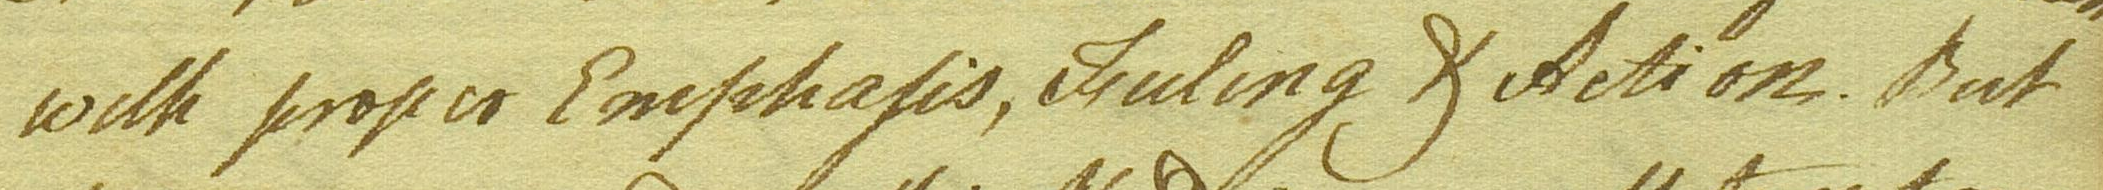with proper Emphasis, Feeling & Action. But
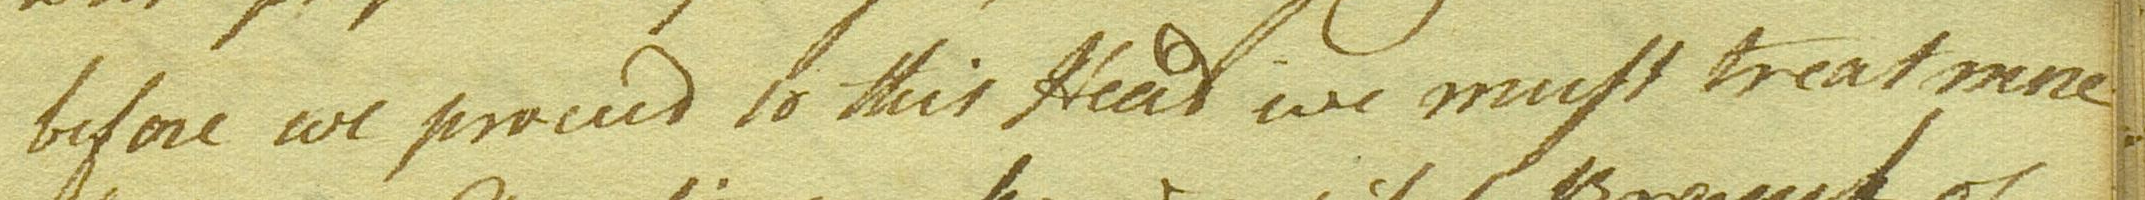before we proceed to this Head we must treat more
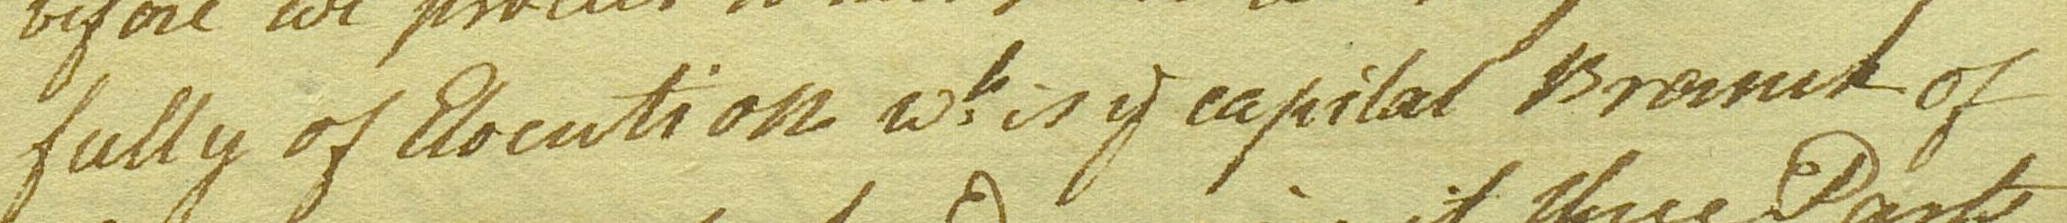fully of Elocution w^h. is y^e capital Branch of
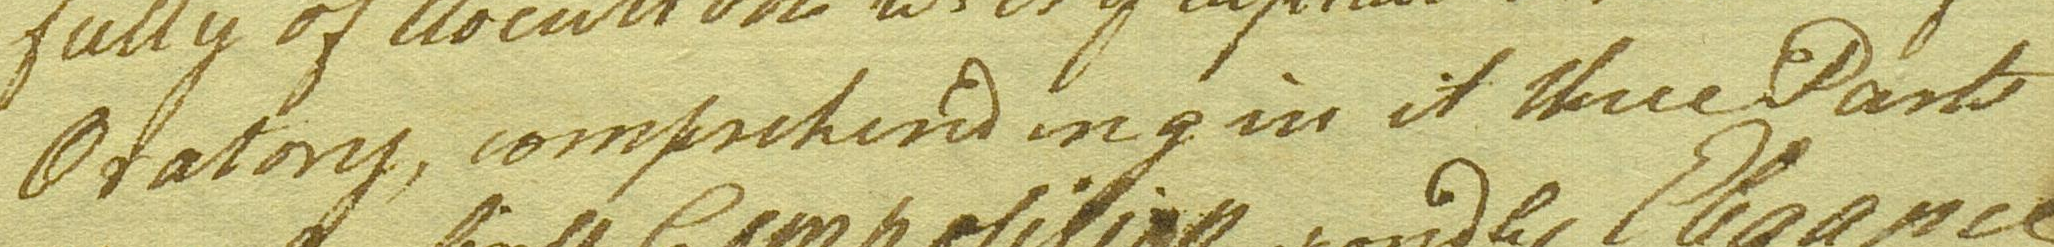Oratory, comprehending in it three Parts
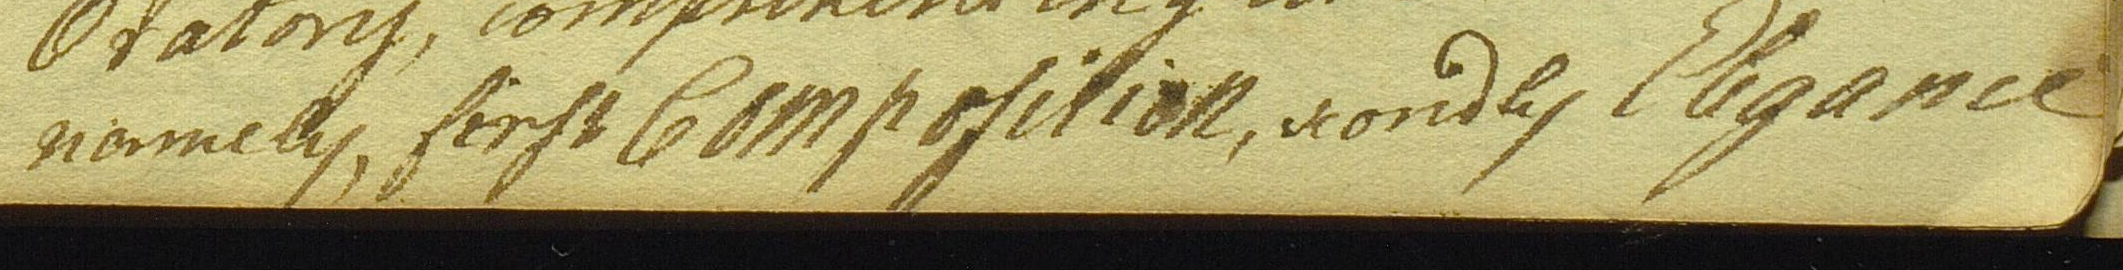namely, first Composition, secondly Elegance
